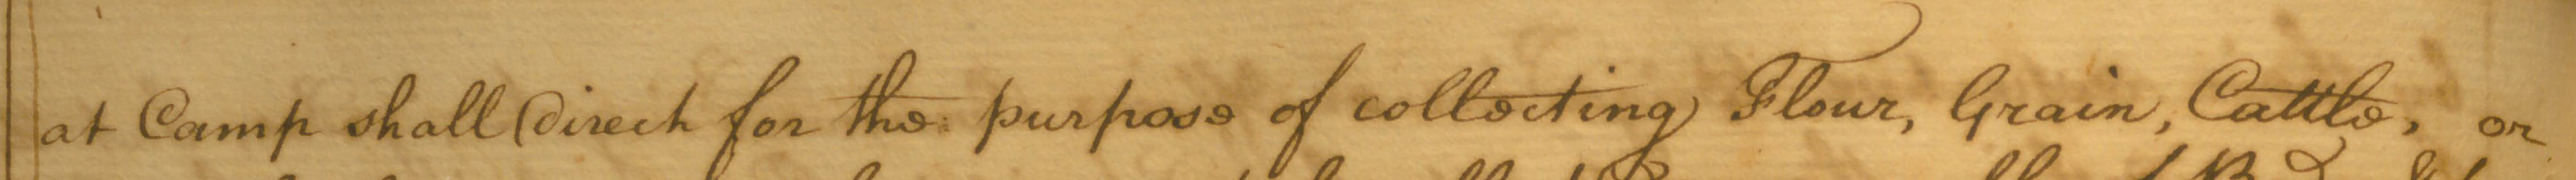at Camp shall direct for the purpose of collecting Flour, Grain, Cattle, or
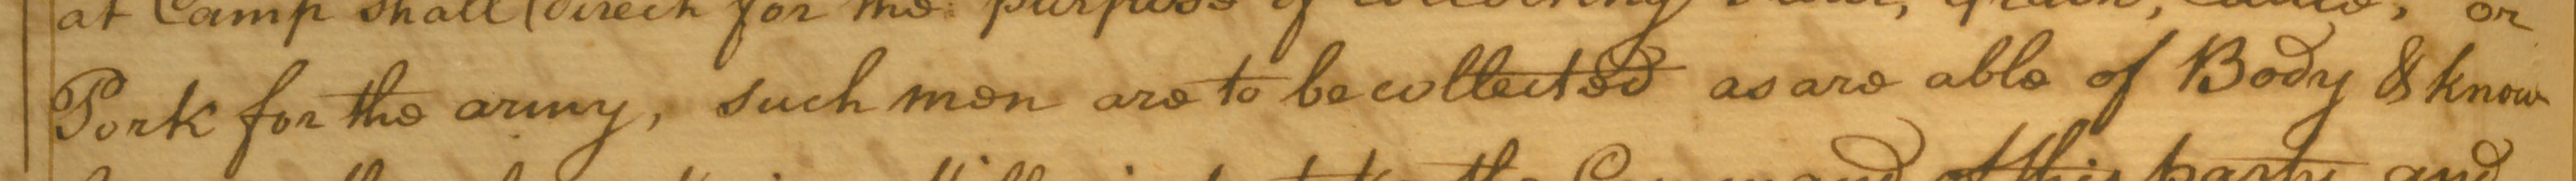Pork for the army, such men are to be collected as are able of Body & know
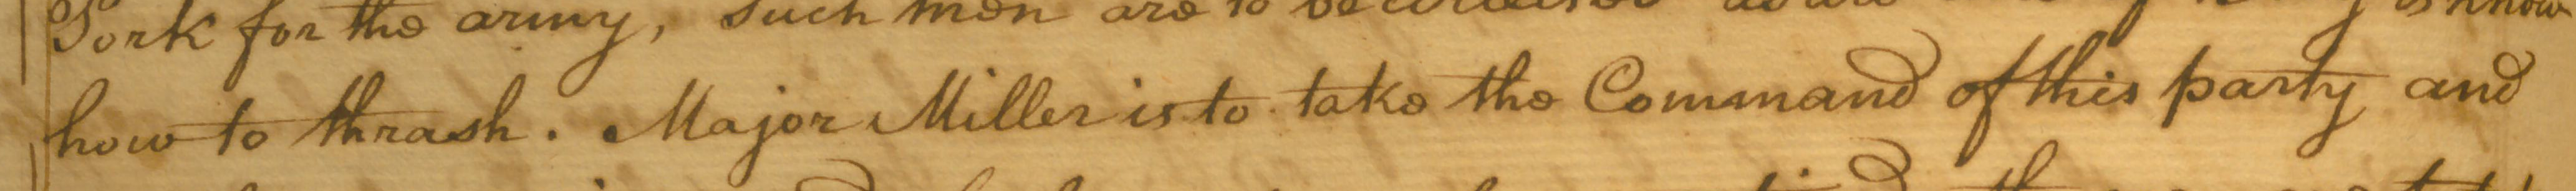how to thrash. Major Miller is to take the Command of this party and
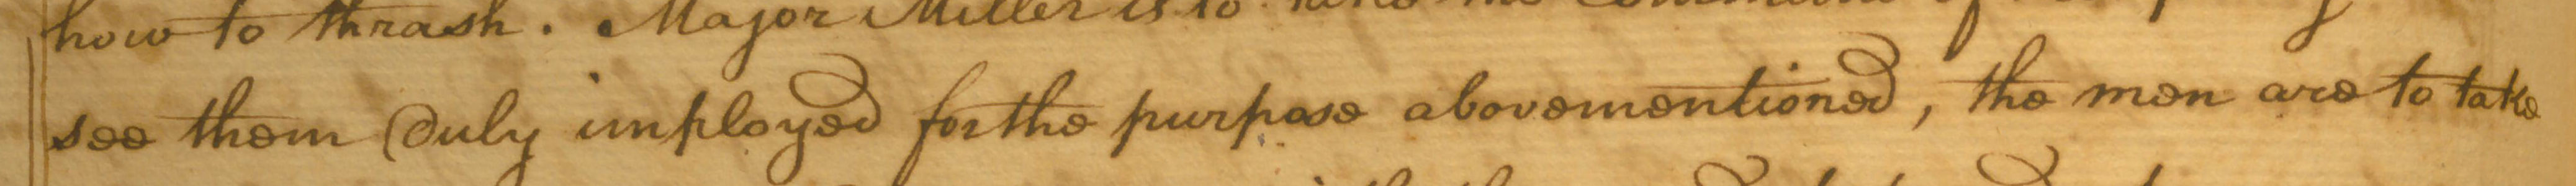see them duly imployed for the purpose above mentioned, the men are to take
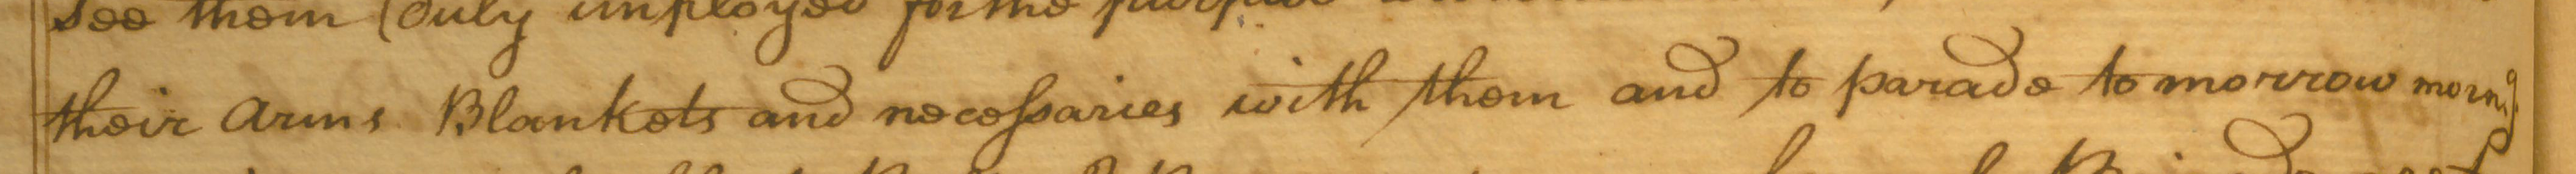their arms Blankets and necessaries with them and to parade tomorrow morn^g.
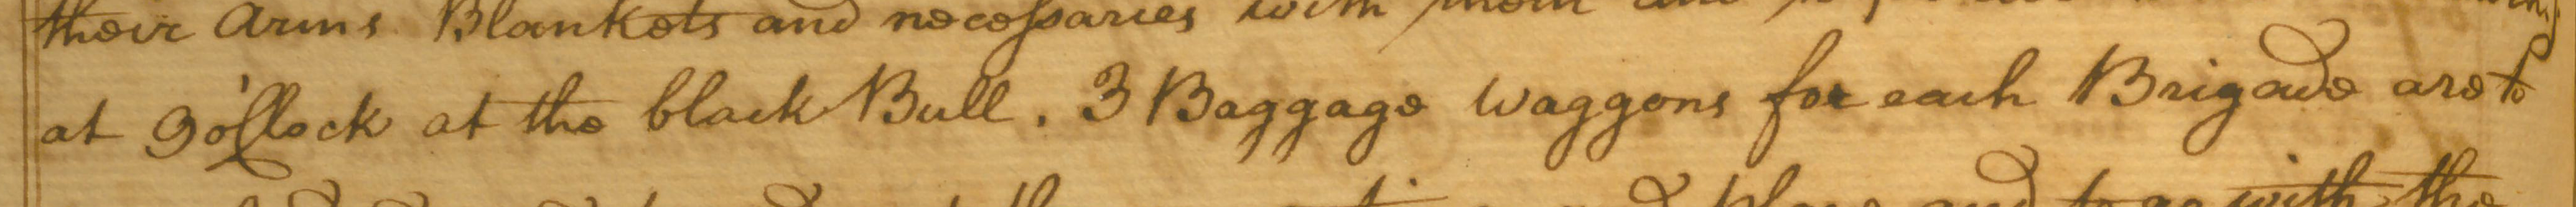at 9 o'Clock at the black Bull. 3 Baggage Waggons for each Brigade are to
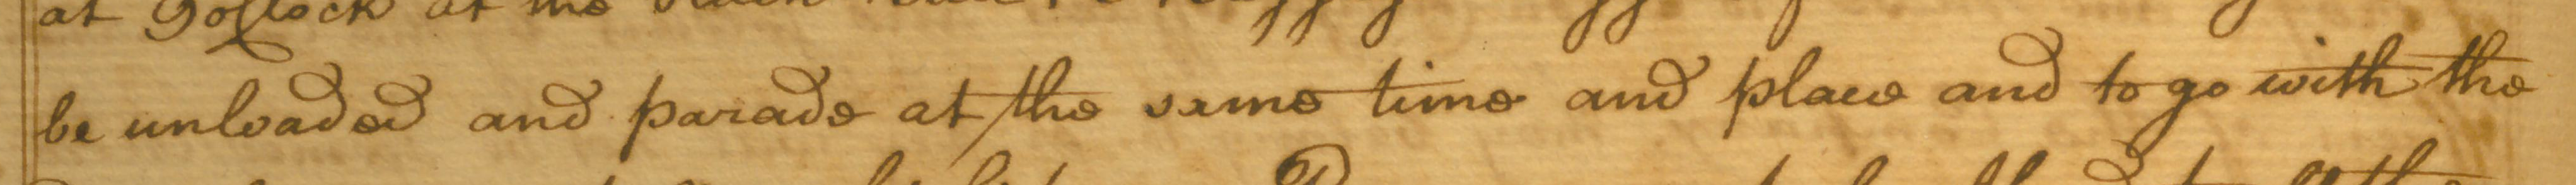be unloaded and parade at the same time and place and to go with the
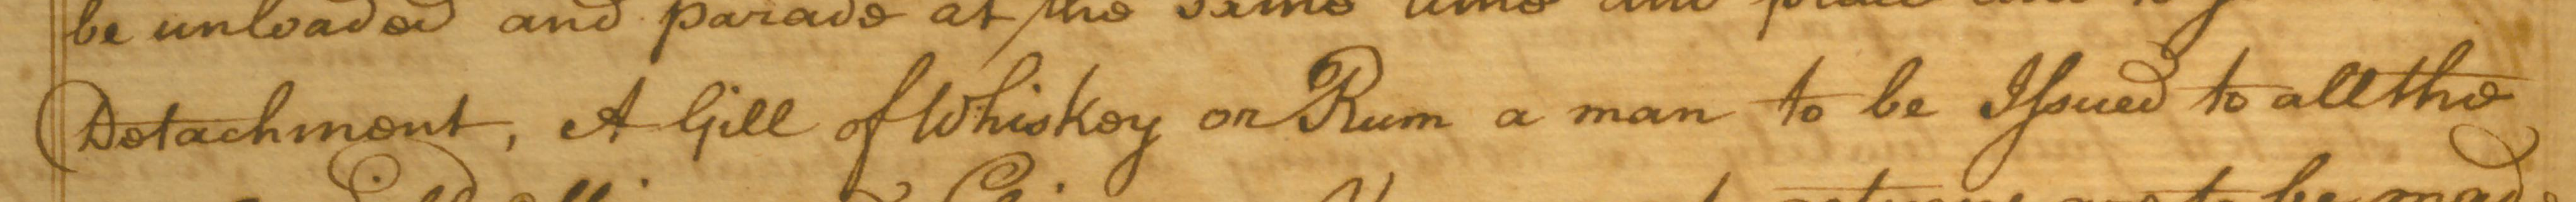Detachment, A Gill of Whiskey or Rum a man to be Issued to all the
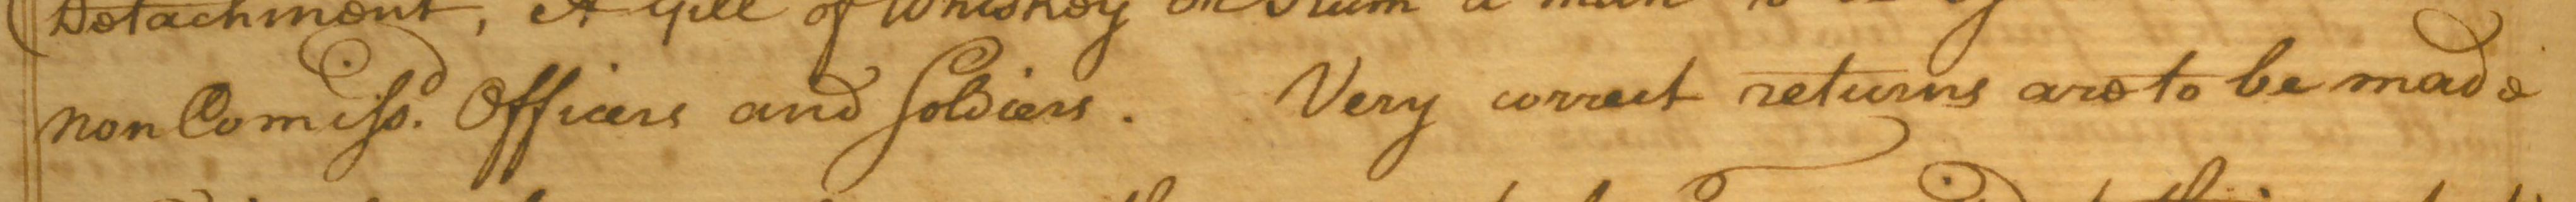non Comiss^d. Officers and Soldiers. Very correct returns are to be made
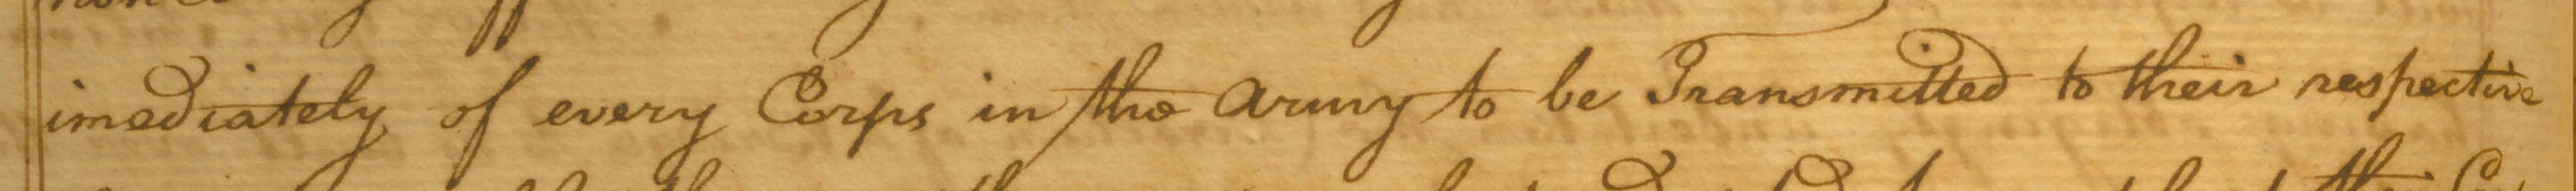immediately of every Corps in the Army to be Transmitted to their respective
